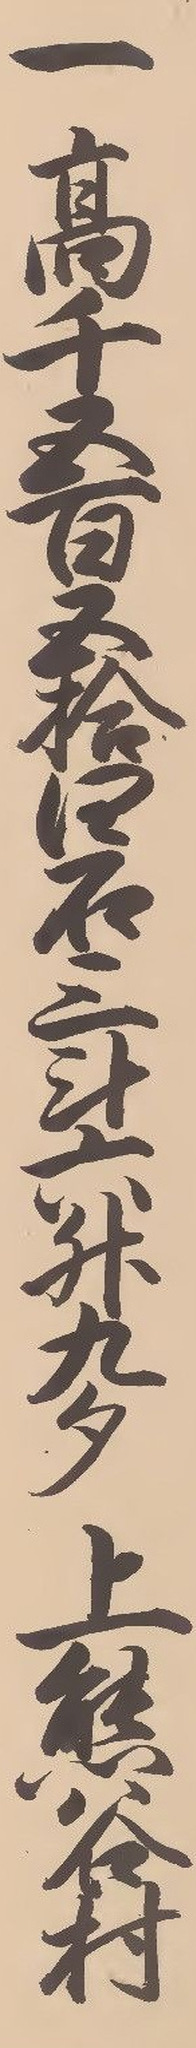一高千五百五拾四石三斗六升九勺上熊谷村
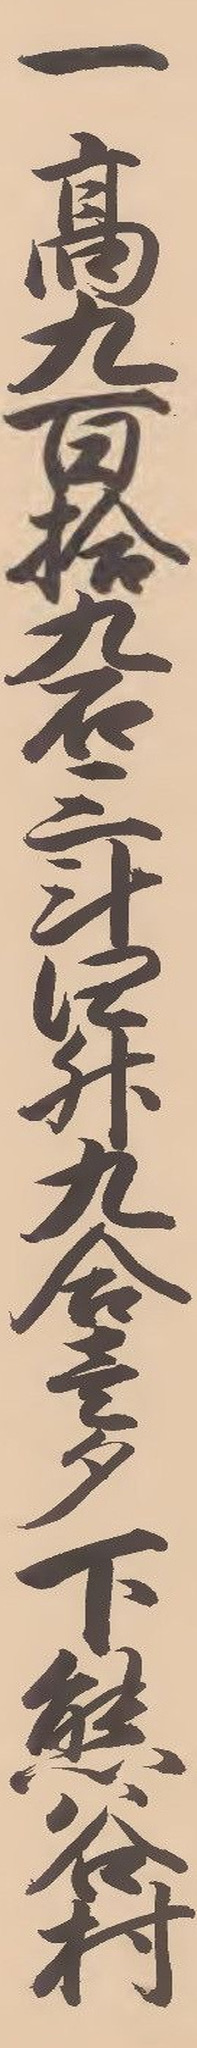一高九百拾九石三斗四升九合壱勺下熊谷村
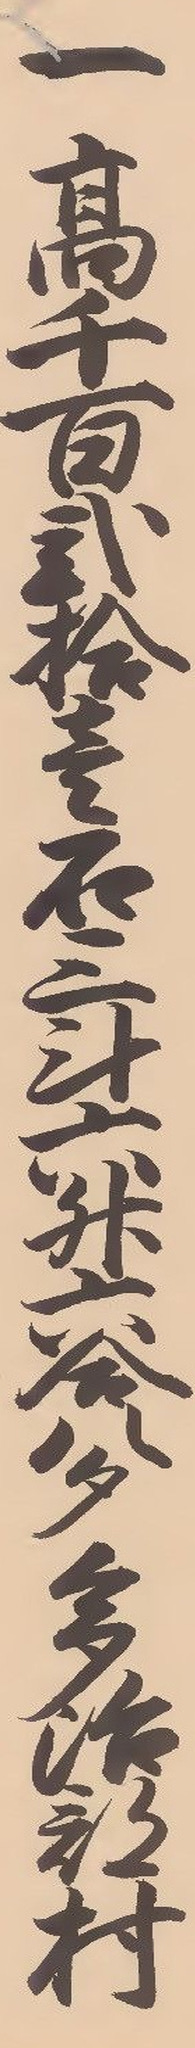一高千百弐拾壱石三斗六升六合八勺多治部村
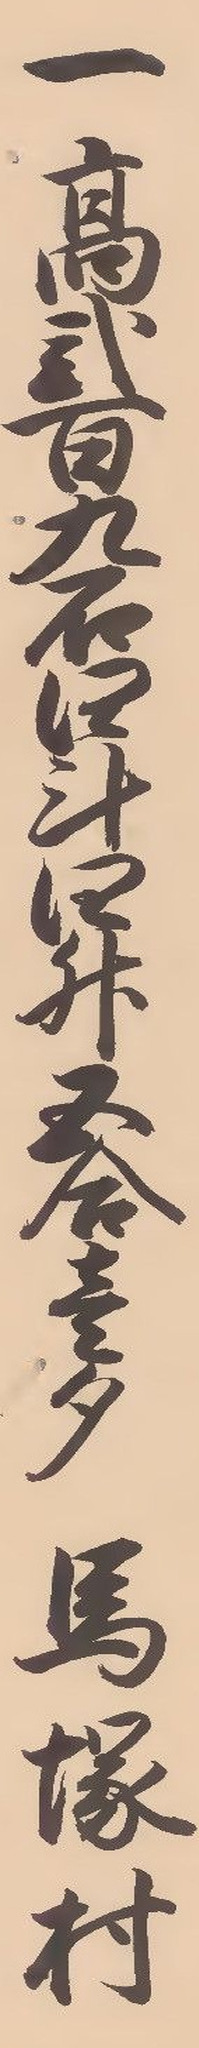一高弐百九石四斗四升五合壱勺馬塚村

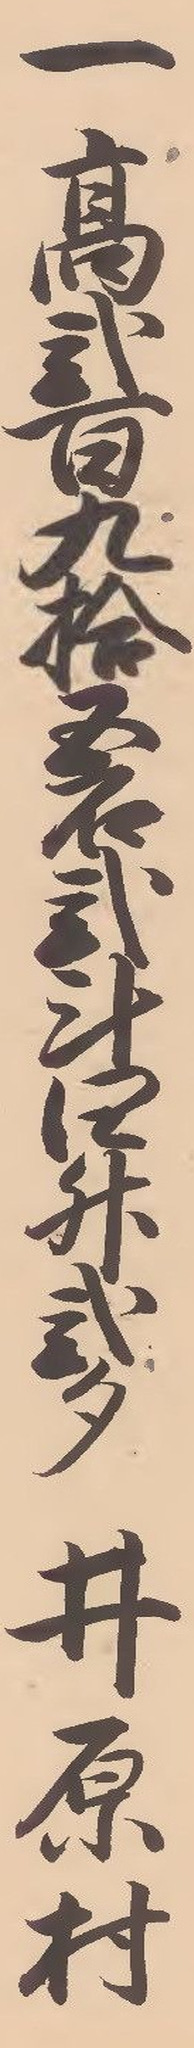一高弐百九拾五石弐斗四升弐勺井原村
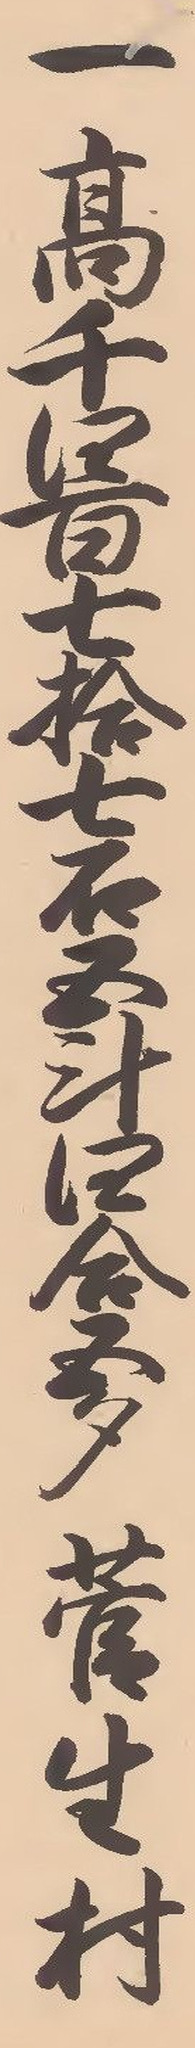一高千四百七拾七石五斗四合五勺菅生村
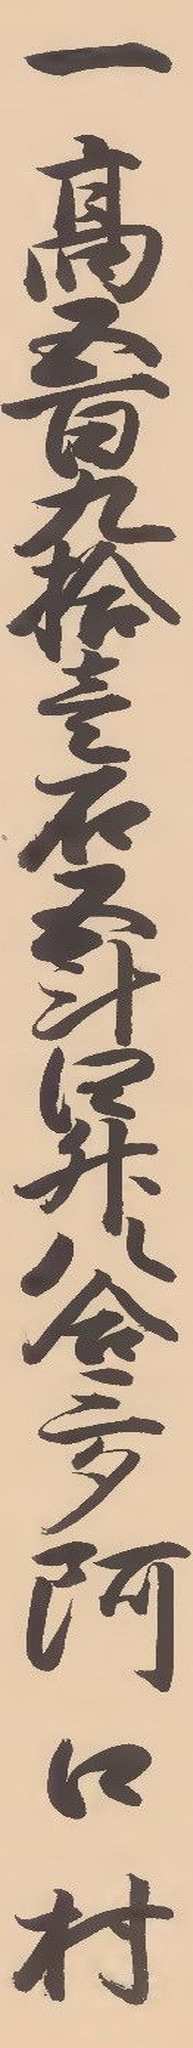一高五百九拾壱石五斗四升八合三勺阿口村
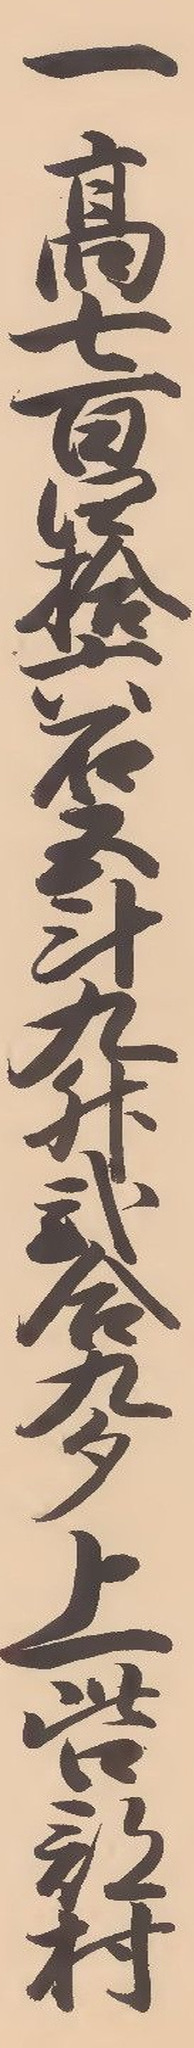一高七百四拾六石五斗九升弐合九勺上皆部村
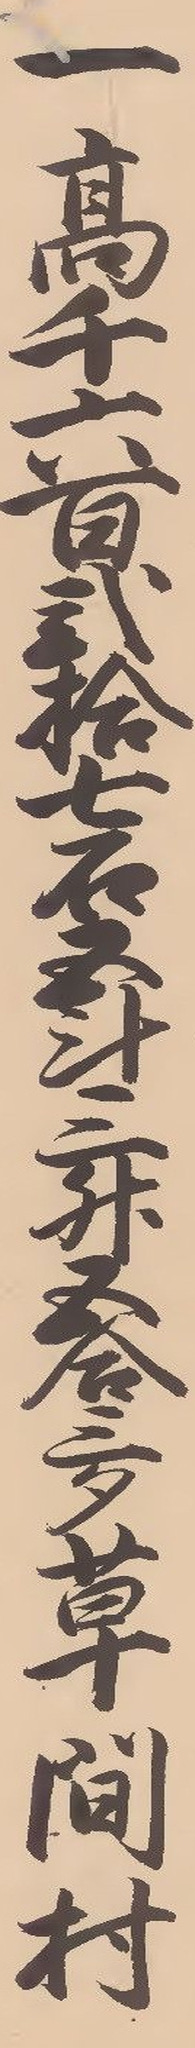一高千六百弐拾七石五斗三升五合三勺草間村
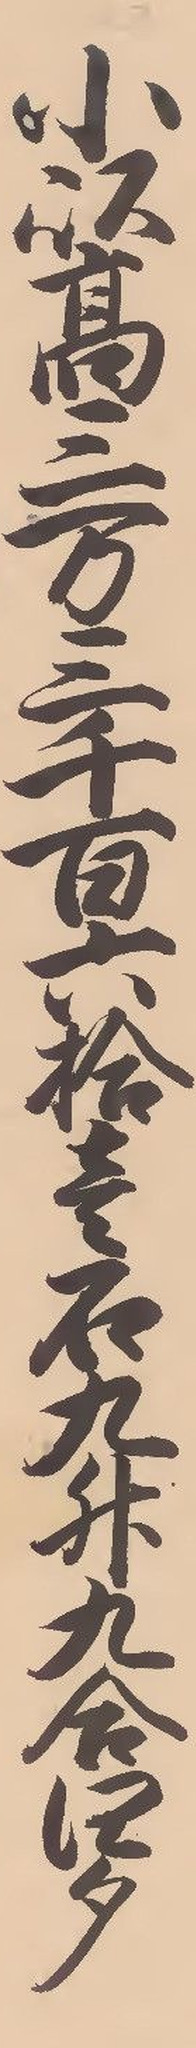小以高三万三千百六拾壱石九升九合四勺

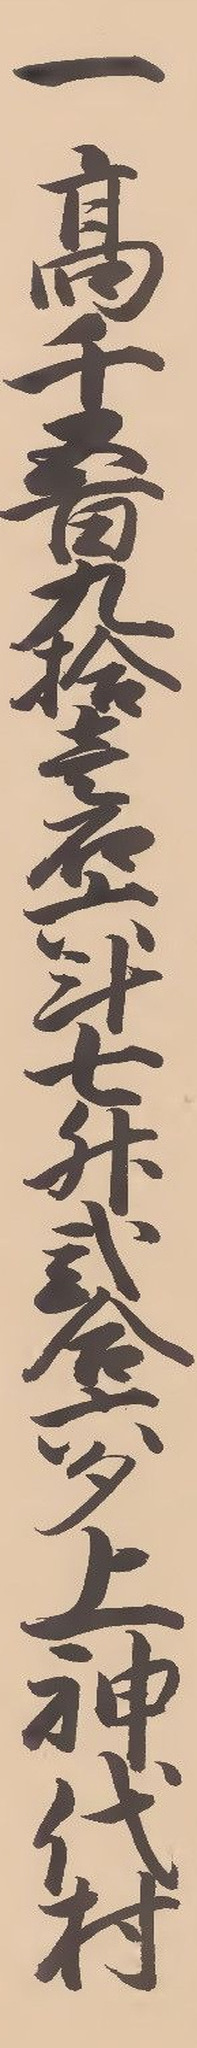一高千五百九拾壱石六斗七升弐合六勺上神代村
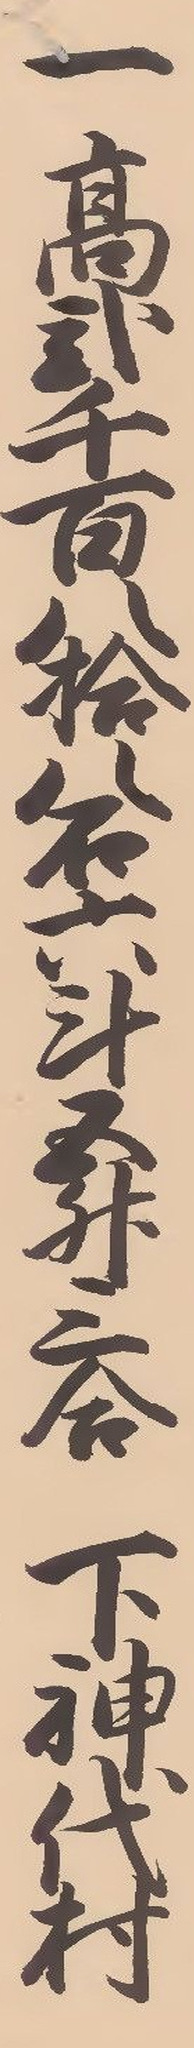一高弐千百八拾八石六斗五升三合下神代村
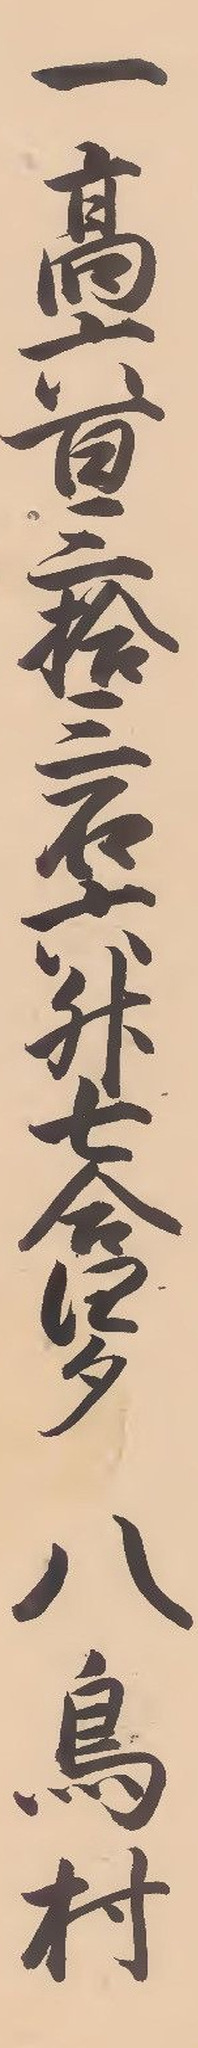一高六百三拾三石六升七合四勺八鳥村

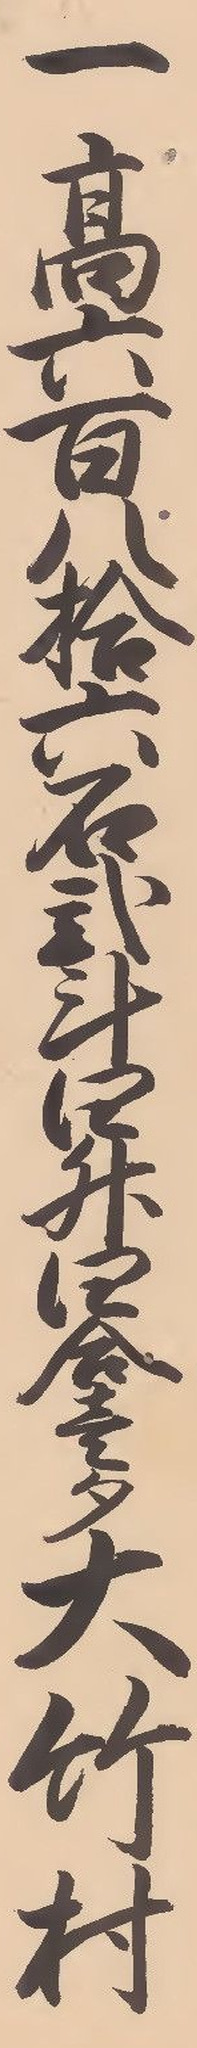一高六百八拾六石弐斗四升四合壱勺大竹村
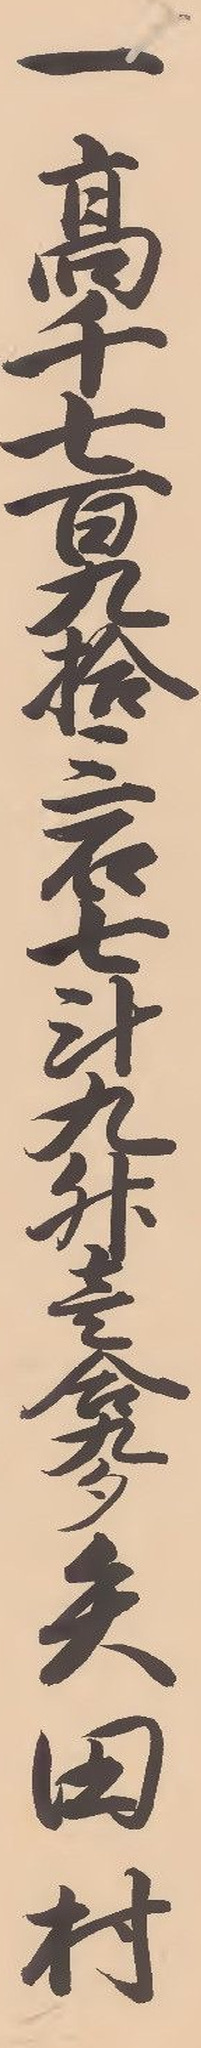一高千七百九拾三石七斗九升壱合九勺矢田村
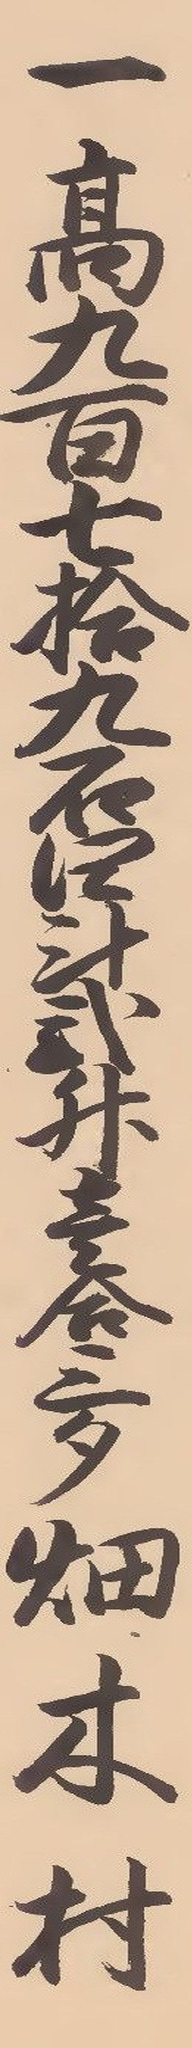一高九百七拾九石四斗弐升壱合三勺畑木村
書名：備中国郷帳
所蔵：国立公文書館 National Archives of Japan
